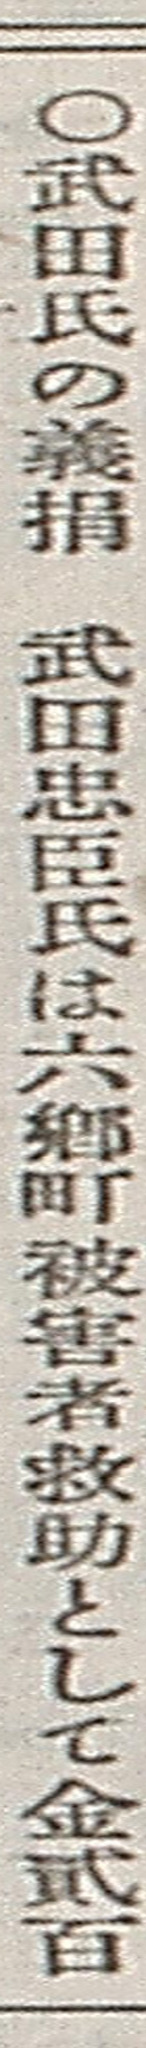〇武田氏の義捐武田忠臣氏は六郷町被害者救助として金弐百
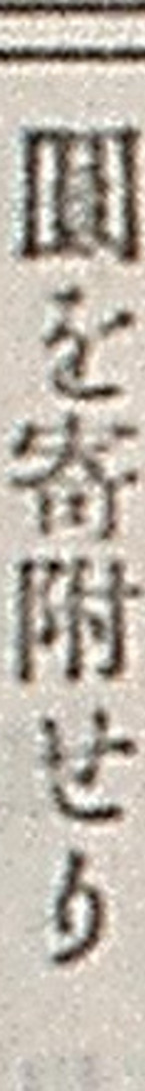円を寄附せり
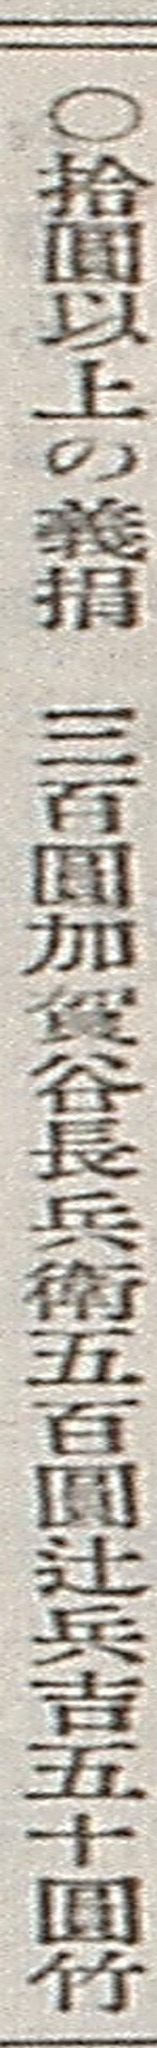〇拾円以上の義捐三百円加賀谷長兵衛五百円辻兵吉五十円竹
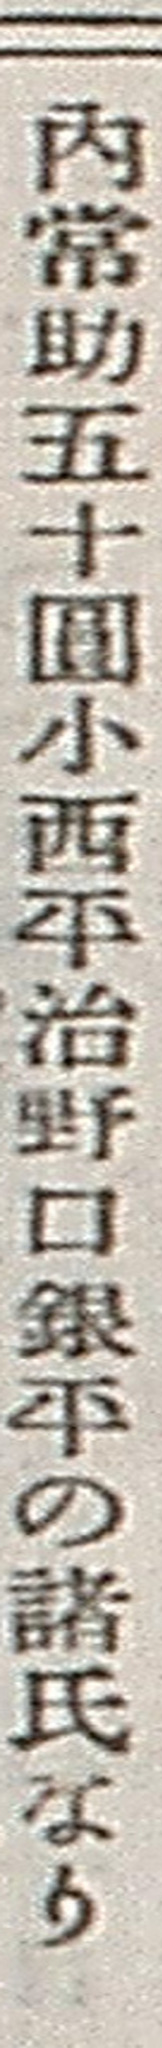内常助五十円小西平治野口銀平の諸氏なり
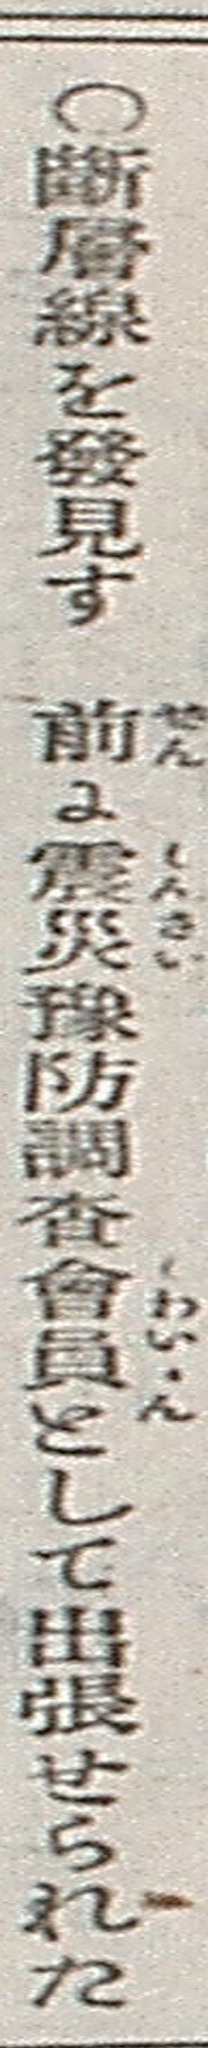〇断層線を発見す前に震災予防調査会員として出張せられた

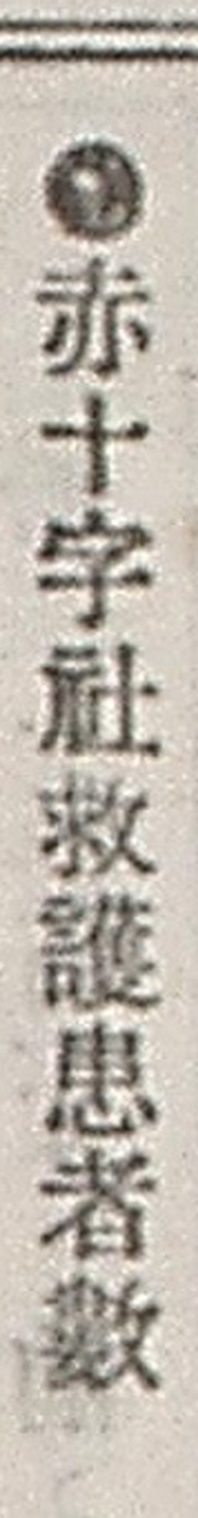●赤十字社救護患者数
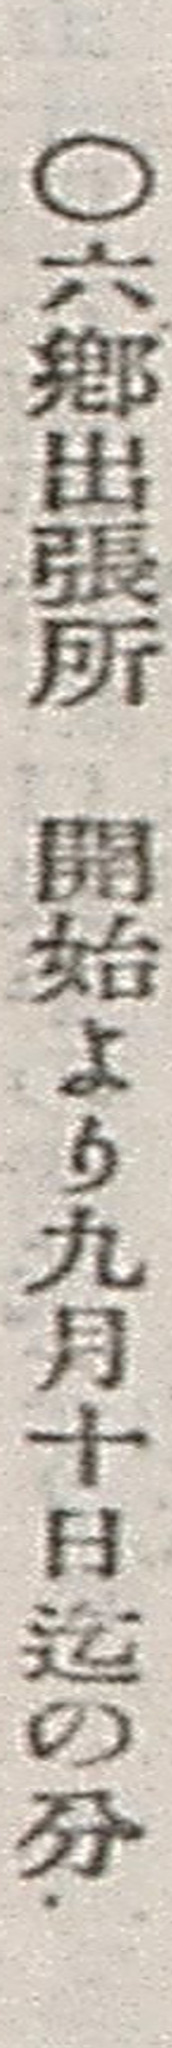〇六郷出張所開始より九月十日迄の分
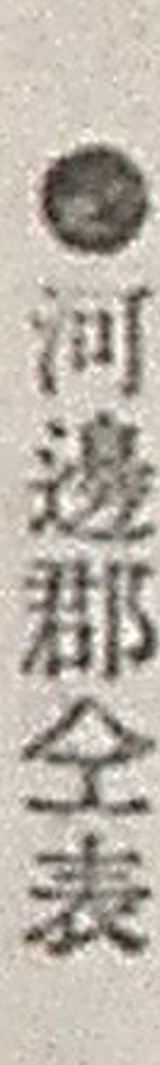●河辺郡仝表
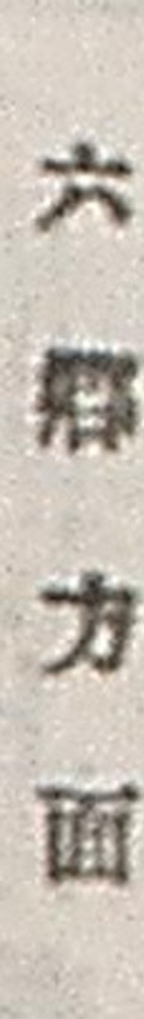六郷方面
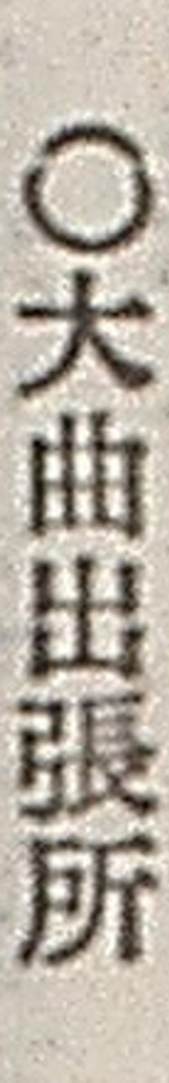〇大曲出張所
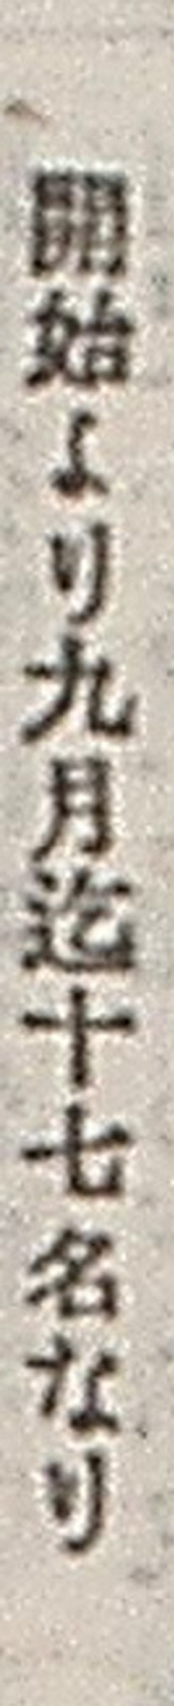開始より九月迄十七名なり
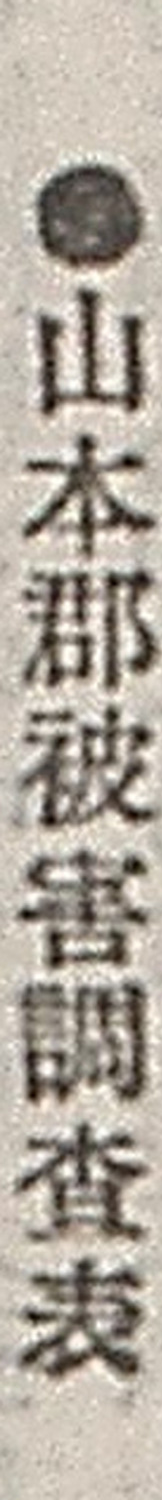●山本郡被害調査表
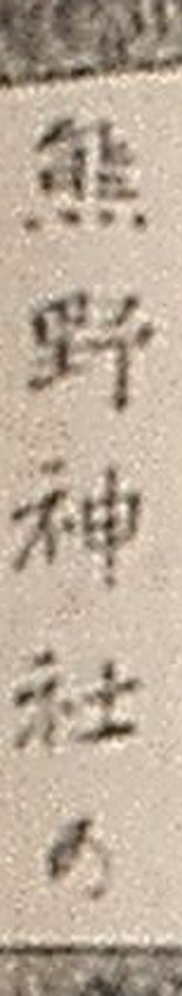熊野神社の
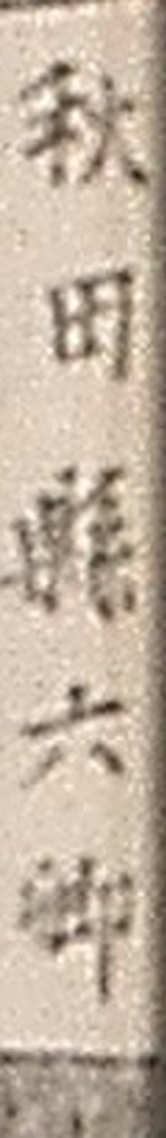秋田県六師
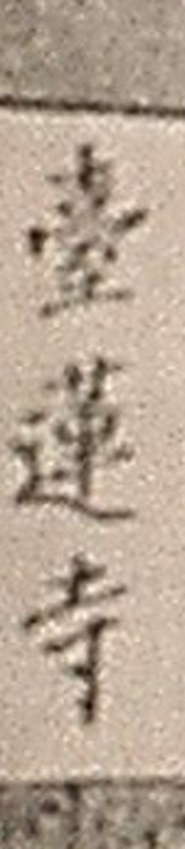台蓮寺
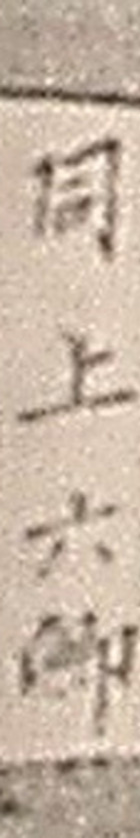同上六師
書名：風俗畫報臨時増刊第百二十四號　洪水地震被害録（上）
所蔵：東京大学地震研究所図書室 Earthquake Research Institute Library, The University of Tokyo, JAPAN
